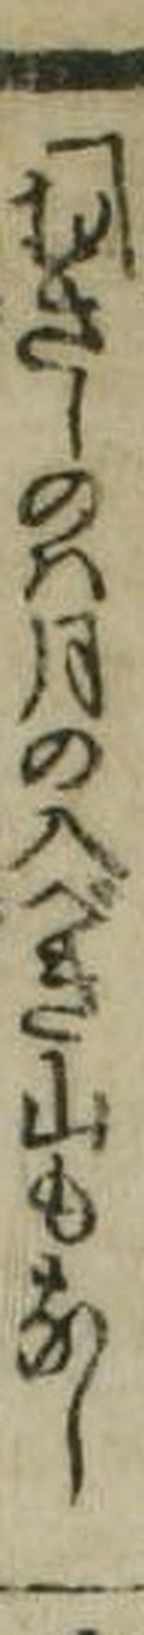〽むさしのは月の入べき山もなし
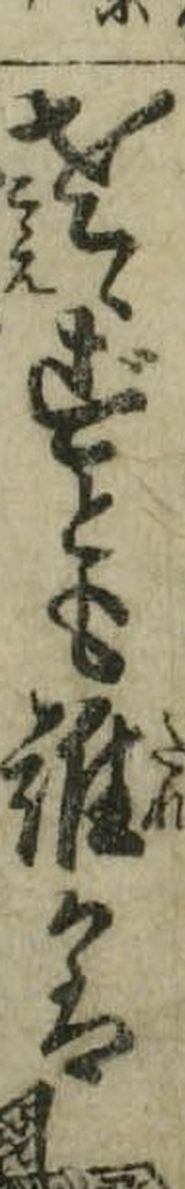さゝずとも誰かは
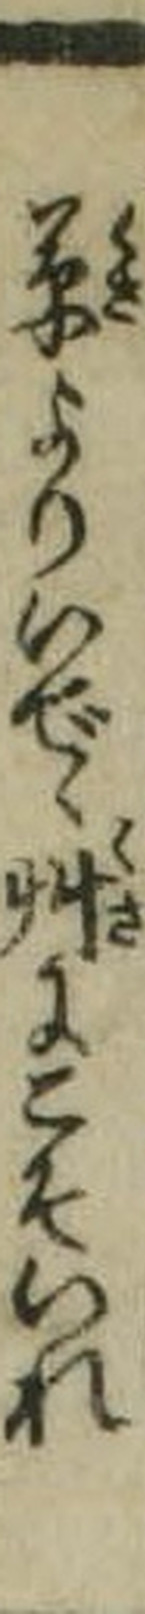草よりいでゝ艸にこそいれ
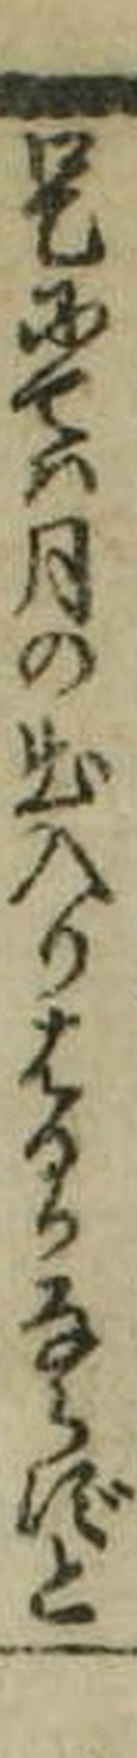是にては月の出入りはるかならずと
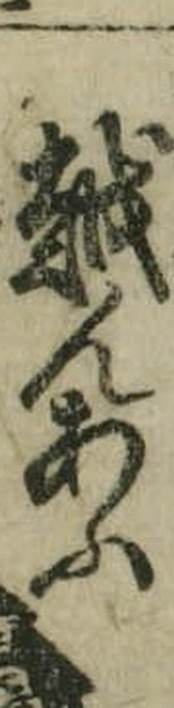越んあふ
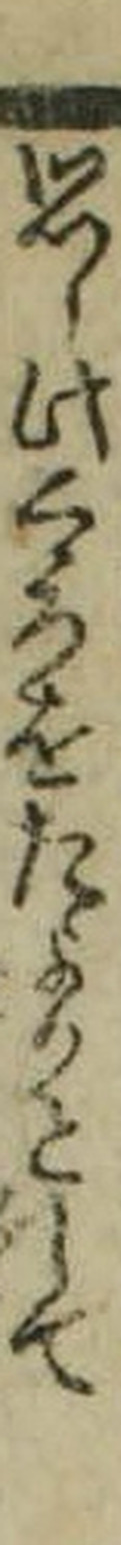思し此こゝろをたよりとして
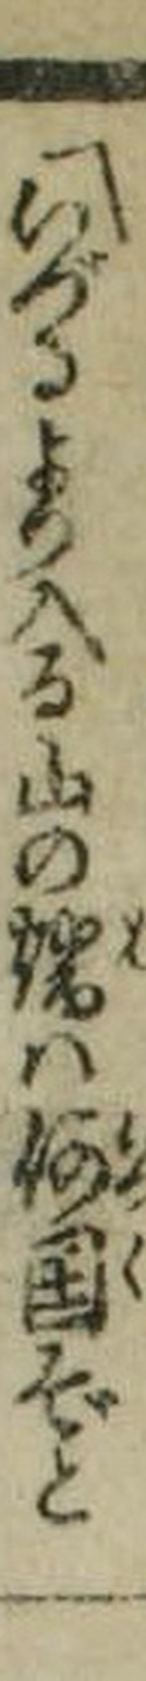〽いづるより入る山の端は何国ぞと
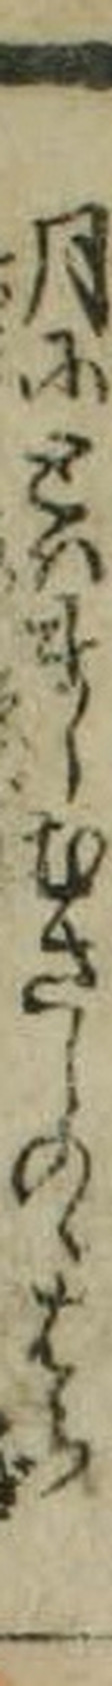月にとはましむさしのゝはら
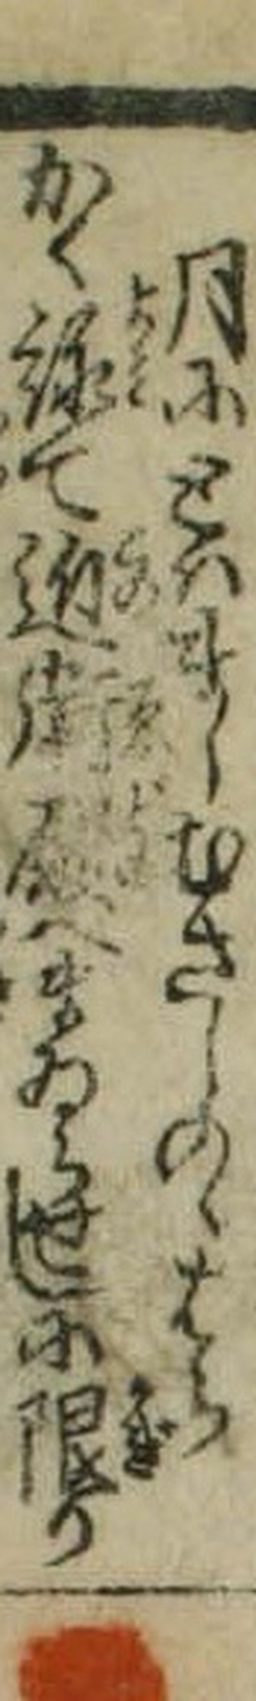かく詠て近衛殿へまゐらせしに限り
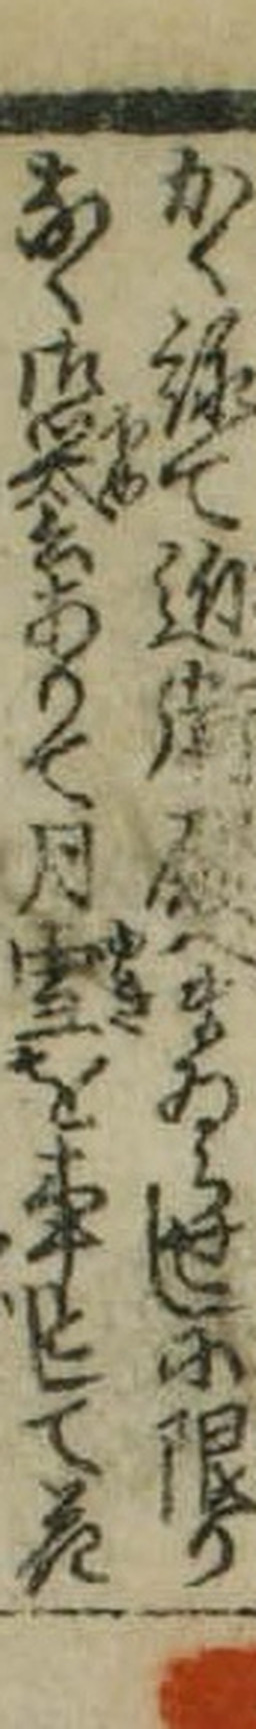なく御誉ありて月雪を事として花
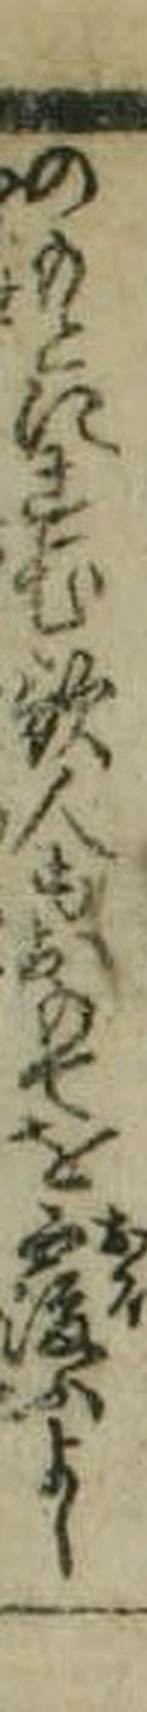のもとにすむ歌人もおもてを覆ふよし
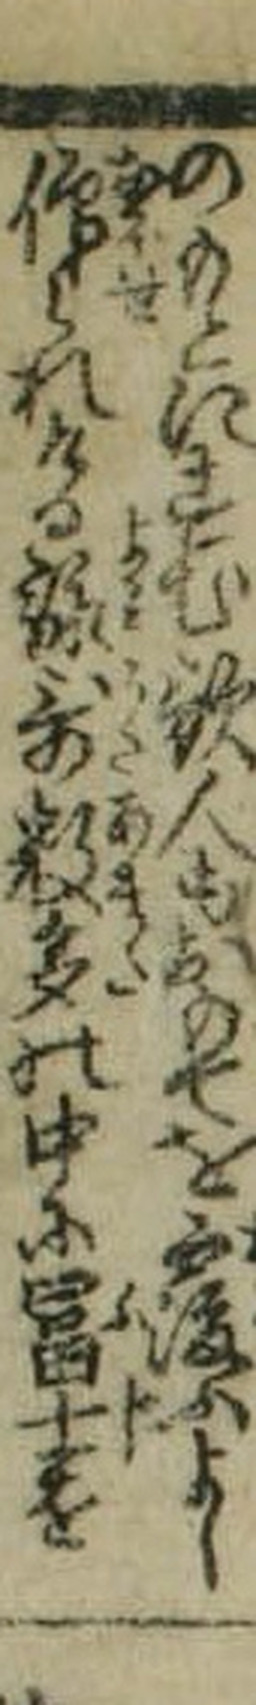仰られける詠哥数多の中に冨士を
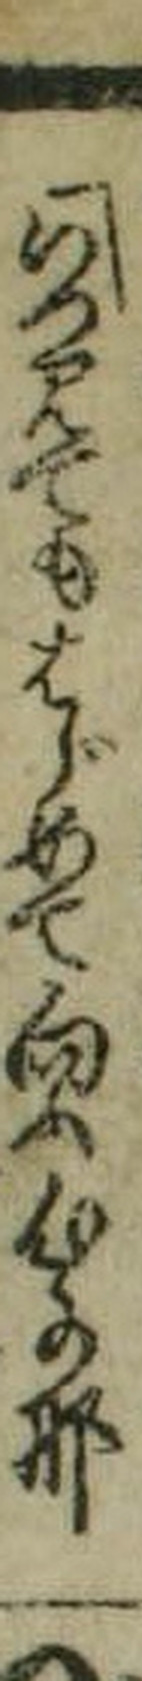〽いつ見てもはじめて向ふ心かな
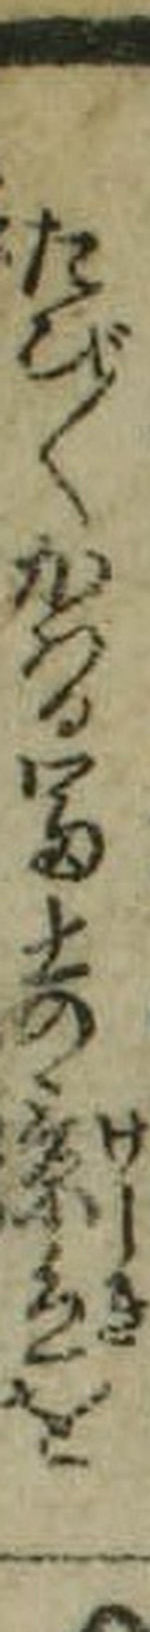たび〳〵かはる冨士の景色を
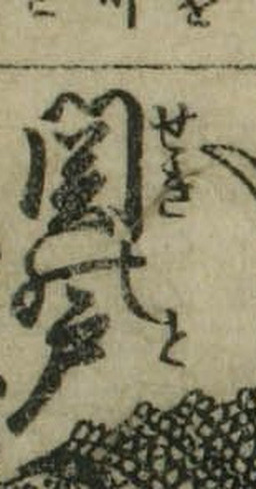関の戸
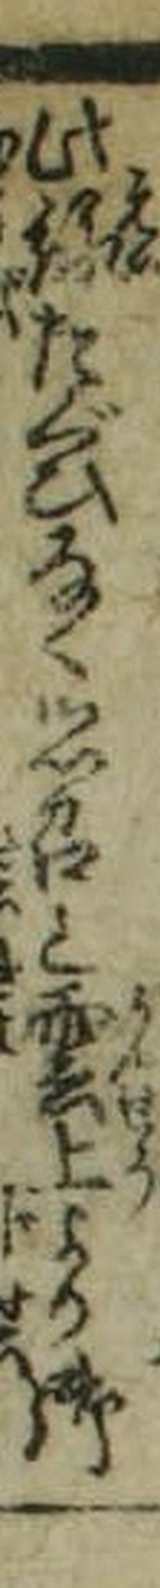此詠たぐひなく思召と雲上より御
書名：續英雄百人一首
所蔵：東京学芸大学附属図書館
